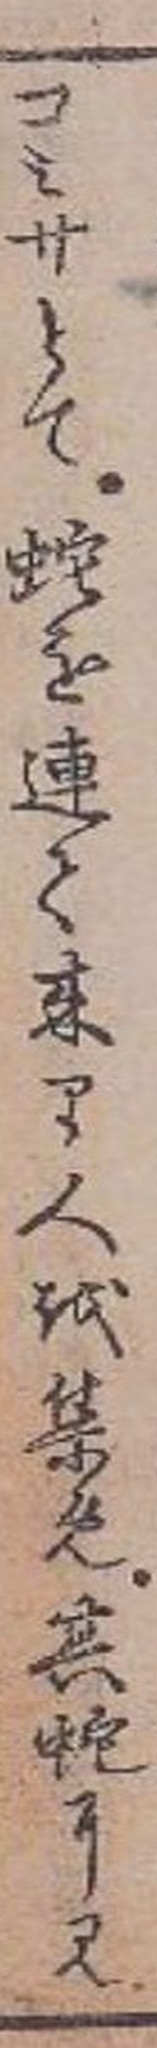コミサとて、蛇を連て来り人を集め、其蛇に見

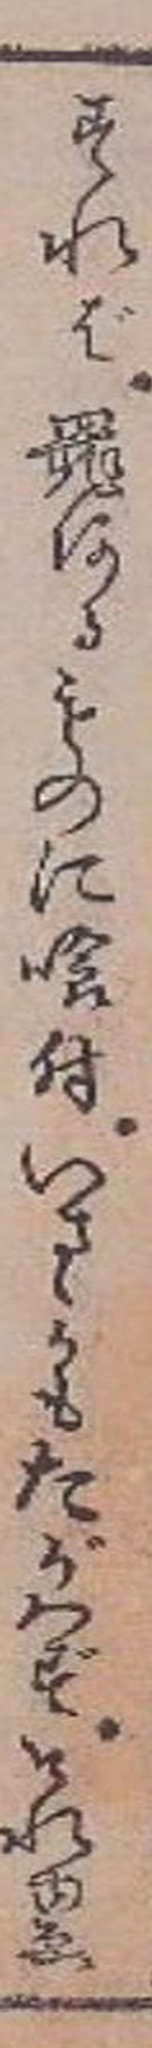すれば、罪あるものに喰付、いさゝかもたがはず、それゆゑ
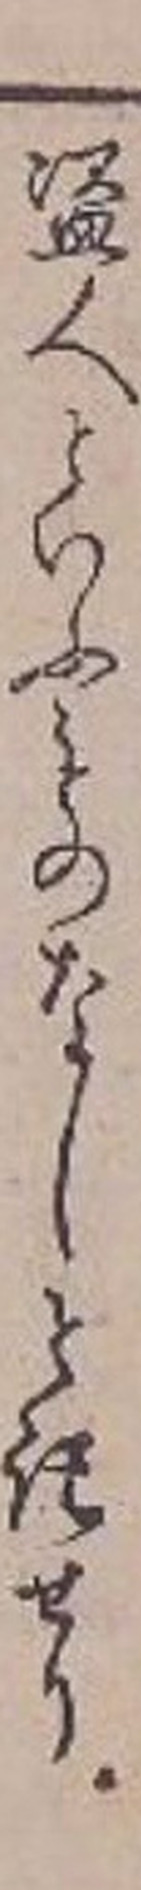盗人といふものなしと記せり、
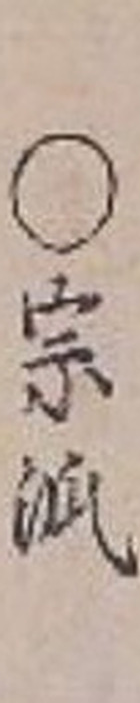○宗派
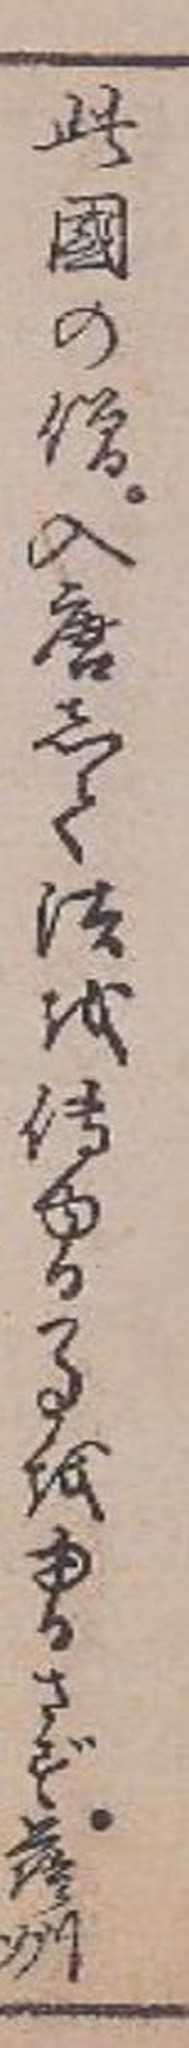此国の僧、入唐して法を伝ゆる事をゆるさず、薩州
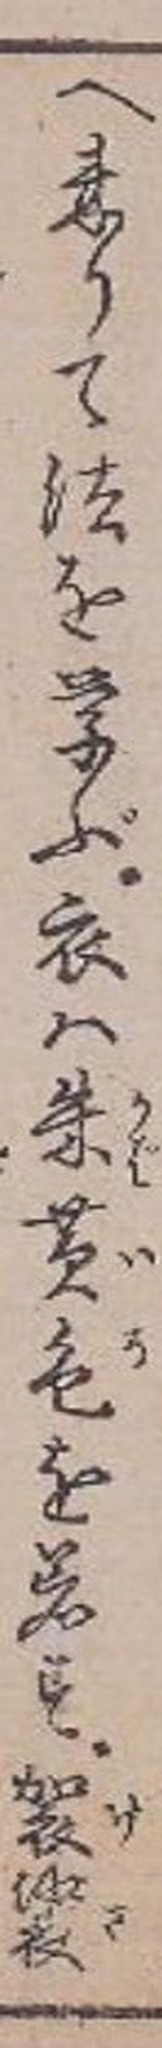へ来りて法を学ぶ、衣は朱黄色を着す、袈裟
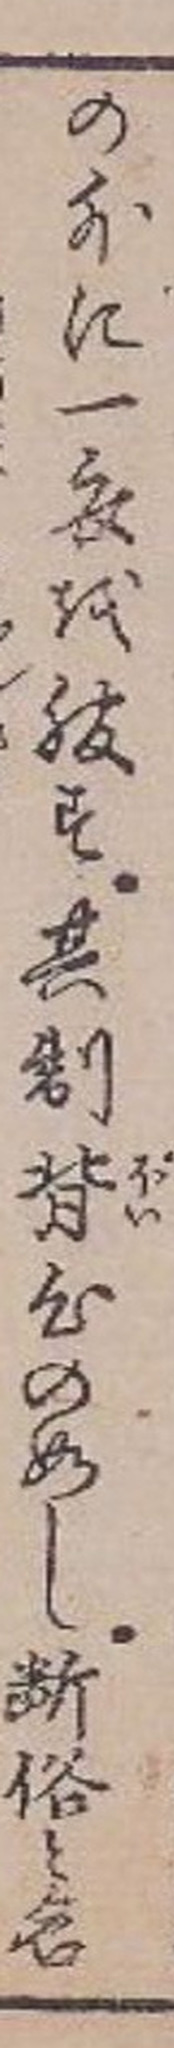の外に一衣を服す、其制背心の如し、断俗と名
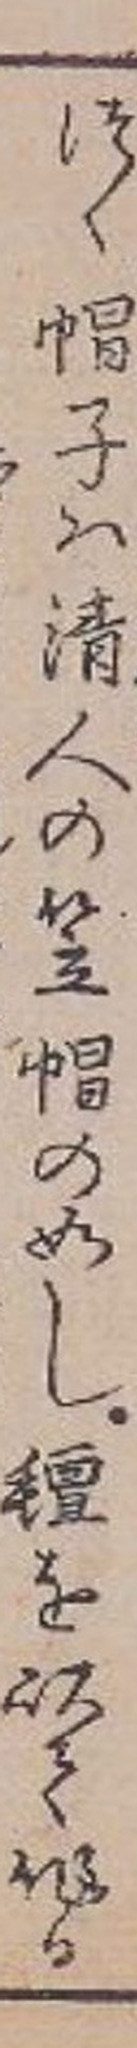づく、帽子は、清人の笠帽の如し、氈を以て作る
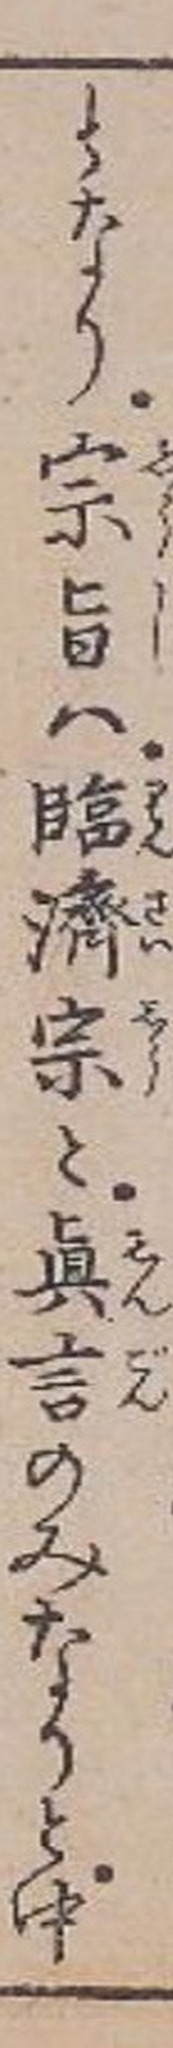となり、宗旨は、臨済宗と、真言のみなりと、中
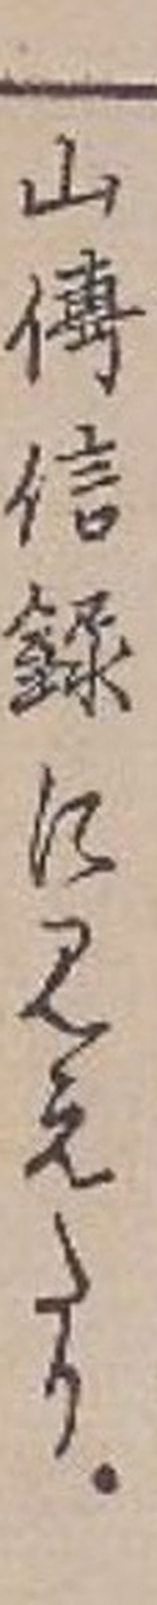山伝信録に見えたり、
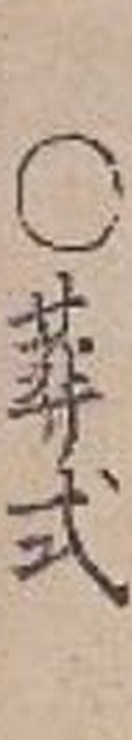○葬式
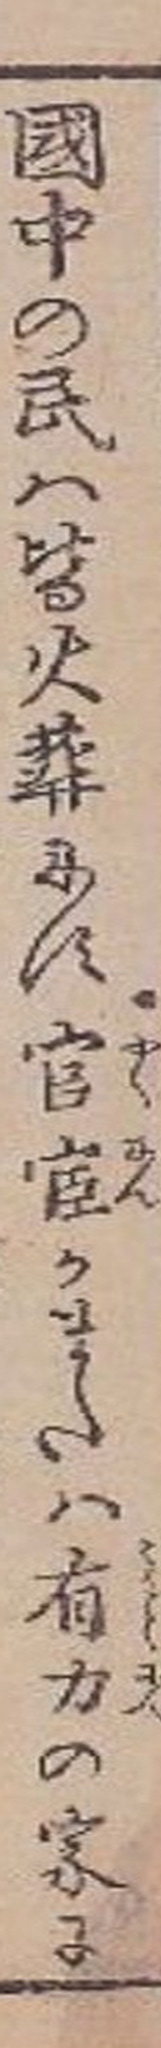国中の民は皆火葬にす、官宦かまたは有力の家に
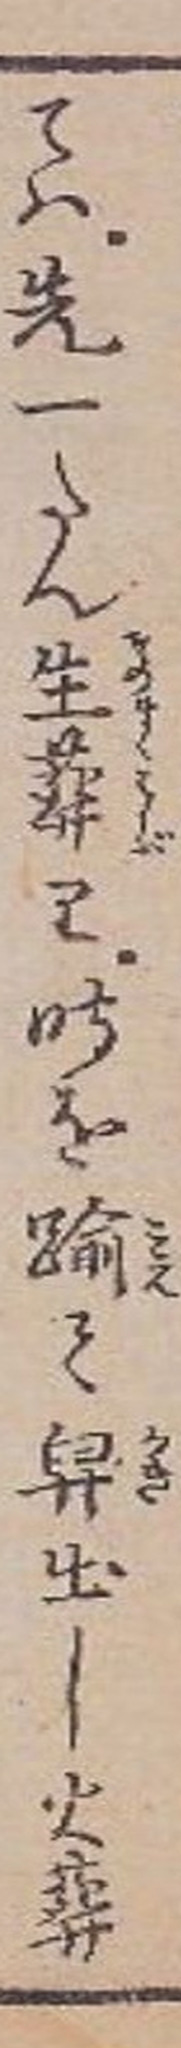ては、先一たん生葬り、時を踰て舁出し火葬
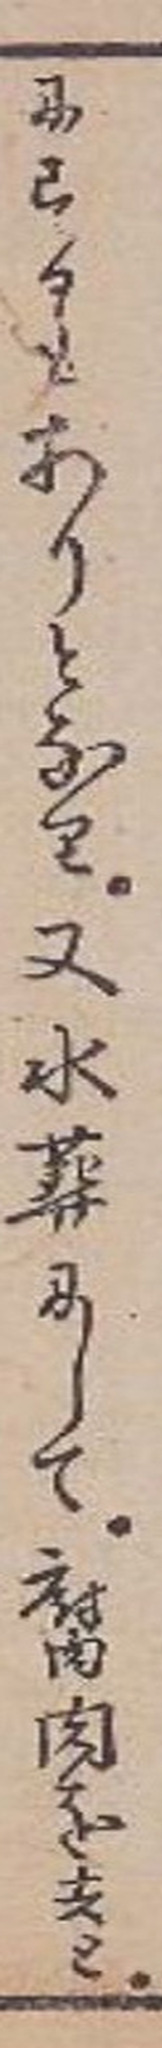にするもありとなり、又水葬にして、腐肉を去と、
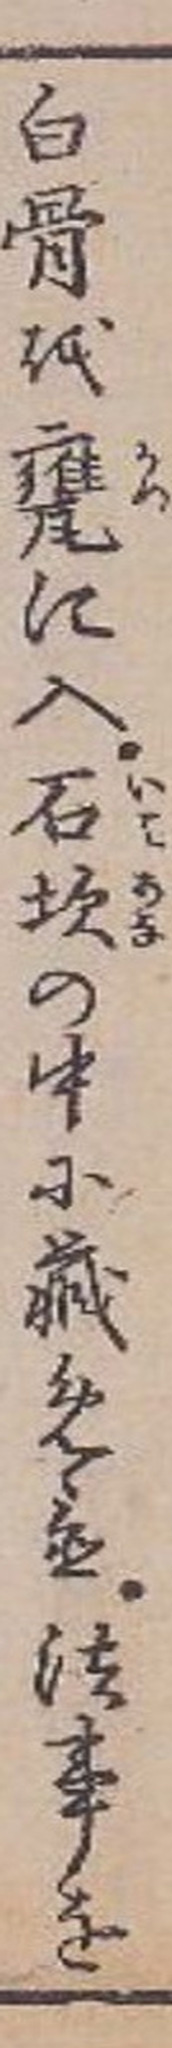白骨を甕に入、石坎の中に蔵め置、法事を
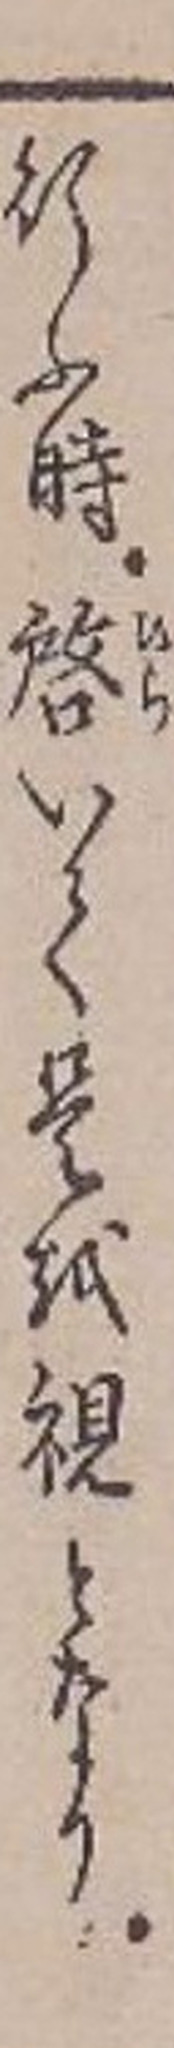行ふ時、啓いて是を視となり、
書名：琉球談
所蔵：University of the Ryukyus Library
